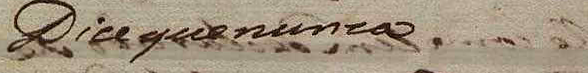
Dice que nunca.
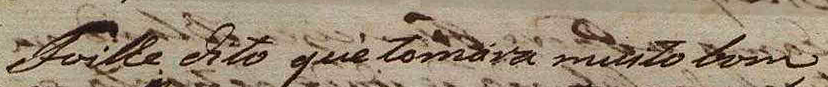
Foi lhe dito que tomára muito bom
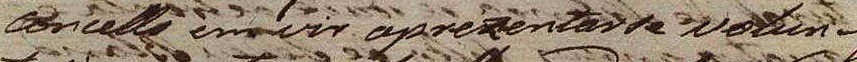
concelho em vir aprezentarse volun
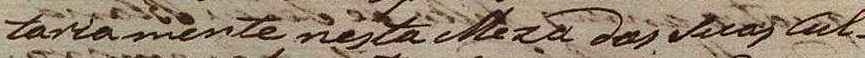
tariamente nesta Meza das suas cul
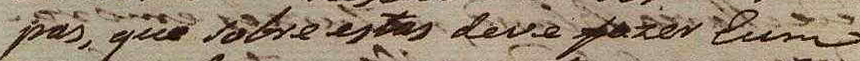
pas, que sobre estas deve fazer hum
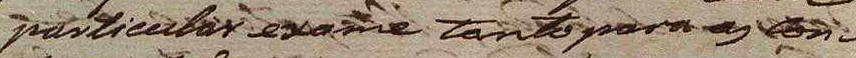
particular exame tanto para as con
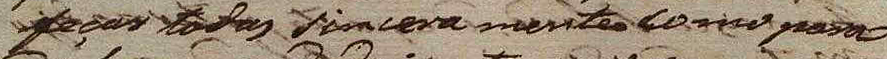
feçar todas simceramente como para
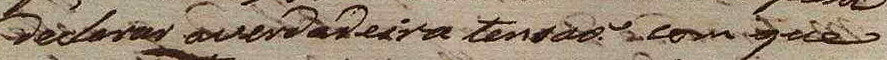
declarar a verdadeira tensaõ com que
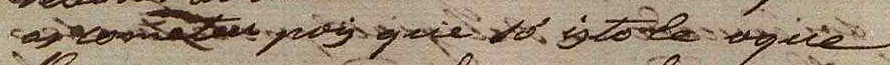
as cometeu pois que só isto he o que
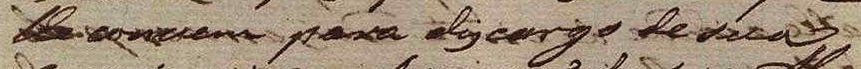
lhe convem para descargo de sua
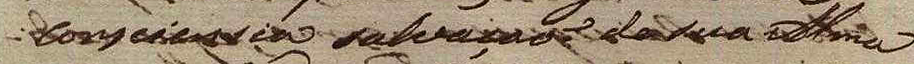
consciensia salvaçaõ da sua Alma
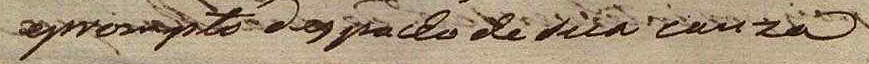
e prompto despacho de sua cauza
